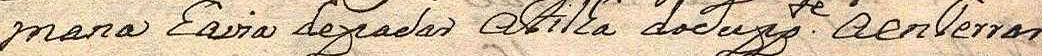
mana havia de pasar a Filha do supp.te a enTerrar
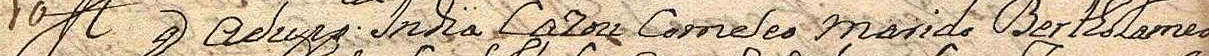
10 item q̄ a supp.da India Cazou com seo marido Bertholameo
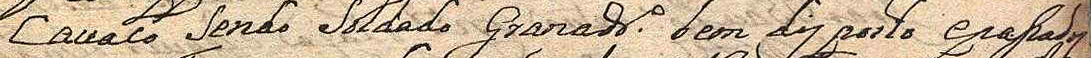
Cavaco sendo soldado Granadr.o bem disposto e passados
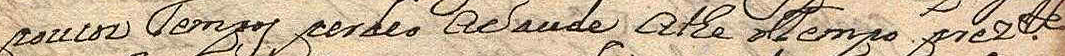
poucoz Tempos perdeo a saude athe o Tempo prez.te
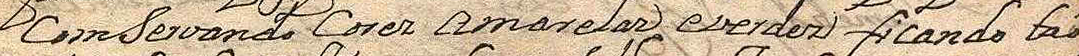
comServando corez amareLaz e verdez ficando taõ
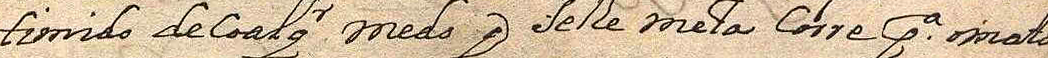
timido de coalqr medo q̄ se lhe meta corre p.a o mato
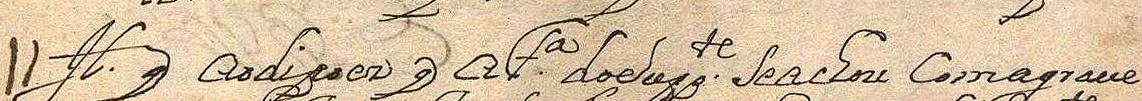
11 item q̄ ao dipoez q̄ a F.a do supp.te se achou com a grave
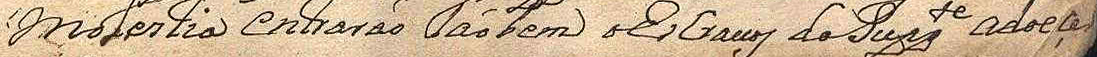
molestia entrarão Tãobem o Escrauos do Supp.te adoeçer
